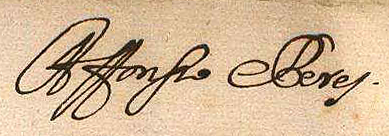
Affonsso Peres.
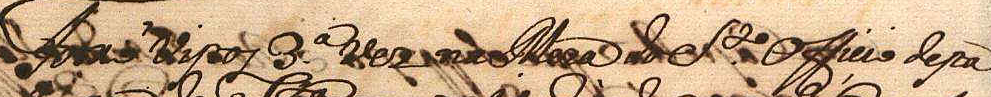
Foraõ vistos 3.a vez na Meza do S.to Officio desta
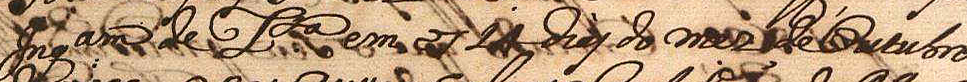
Jnqam de L.xa em os 14 dias do mez de Outubro
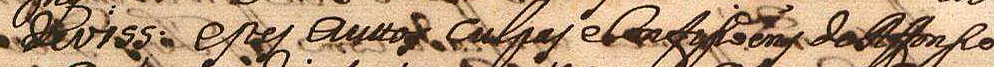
de 1755: estes Auttos, culpas, e Confissoẽns de Affonsso
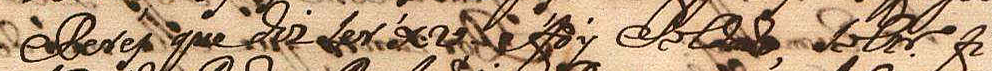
Peres que diz ser xv e foy Soldado, soltr.o fi
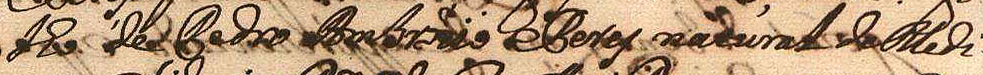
lho de Pedro Ambrozio Peres, natural de Medi
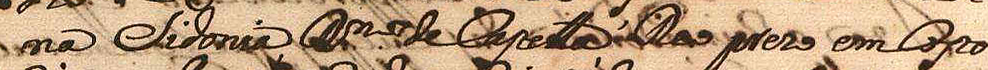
na Sidonia R.no de Castella, Reo prezo em Costo
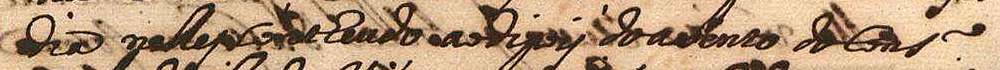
dia, nelles contheudo, ao dipois do asento do Cons.o
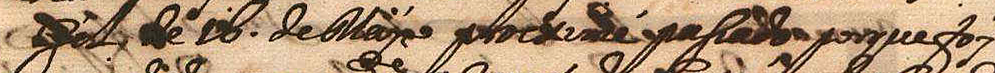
Gal de 16. de Mayo procximé passado, porque foj
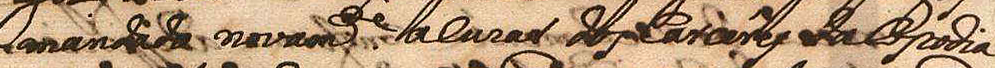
mandado novam.te aCuzar dos Carceres da Costodia
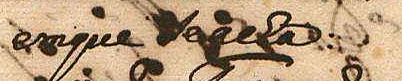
em que se acha:
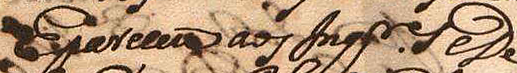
E pareceu aos Jnq.res e De
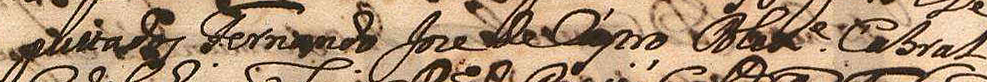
putados Fernando Joze de Castro, Alex.e CabraL
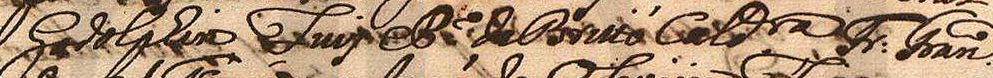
Godolphin, Luis P.o de Britto Caldra, Fr: Fran.co
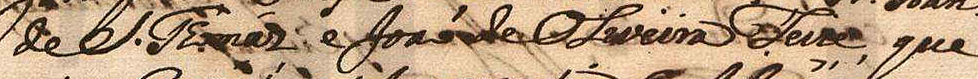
de S. Thomaz, e Joaõ de OLiveira Leite, que
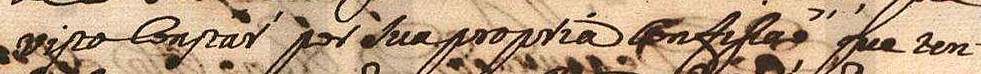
visto Constar por sua propria confissaõ, que ten
